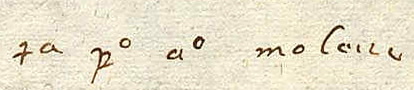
ta po ao moleiro
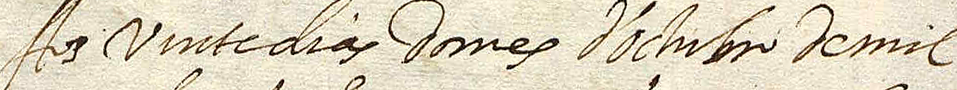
Aos vinte dias do mes d'octubro de mil
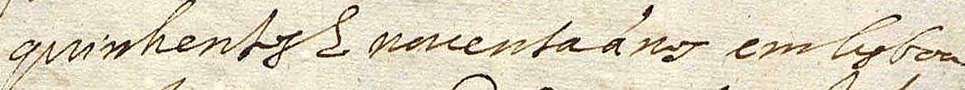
quinhentos E nouenta an̄os em lisboa
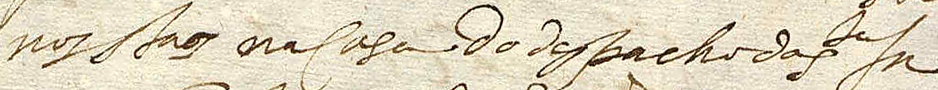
nos staos na Casa do despacho da Sta Jn
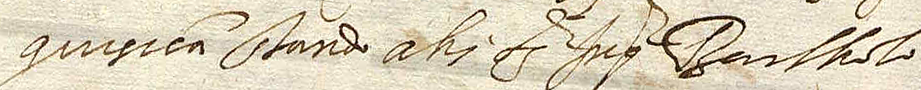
quisicā stando ahi o Sr Jnqr Bartholo
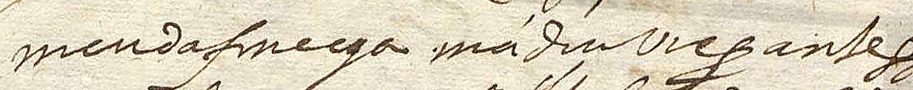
meu da fonceqa mādou vir ꝓante sj
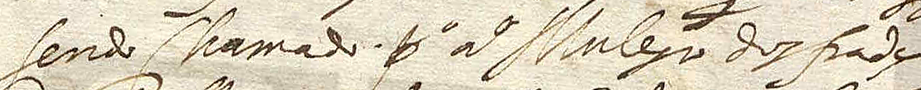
sendo Chamado . po ao Mulejro dos frades
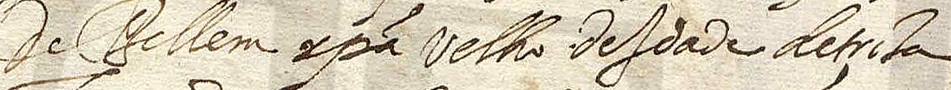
de Bellem xpā velho de Jdade de trīta
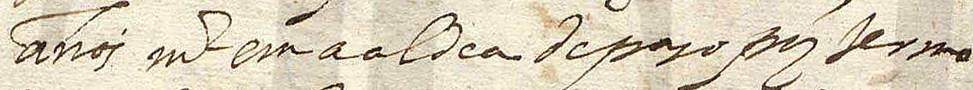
ānos mr em a aldea de paio pīz termo
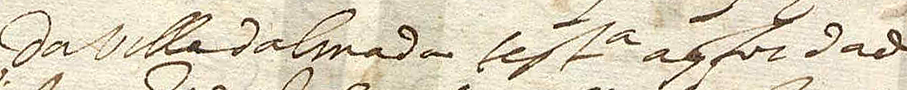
da villa dalmada testa a q̄ foi dado
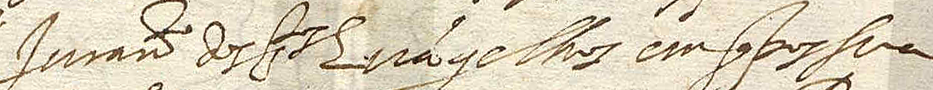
Juramto dos Stos Euāgelhos em q̄ pos sua
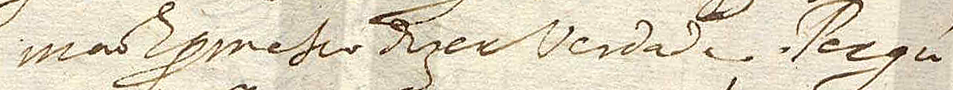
mão E ꝓmeteo dizer verdade. Pergū
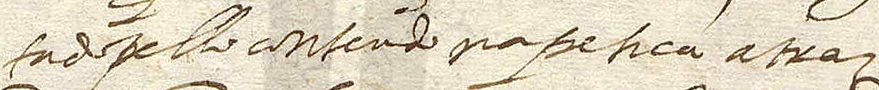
tado pello conteudo na peticā atraz
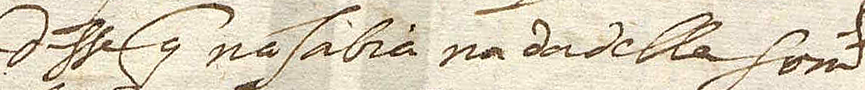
disse q̄ nā sabia nada delle somte
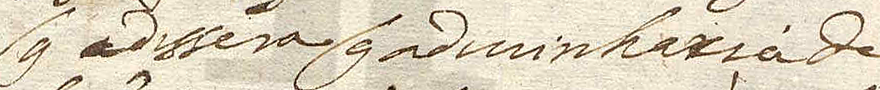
q̄ _ dissera q̄ adiuinharia de
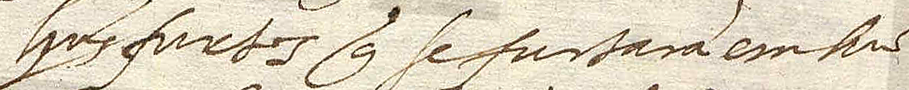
hus̄ furtos q̄ se furtarā em hū
